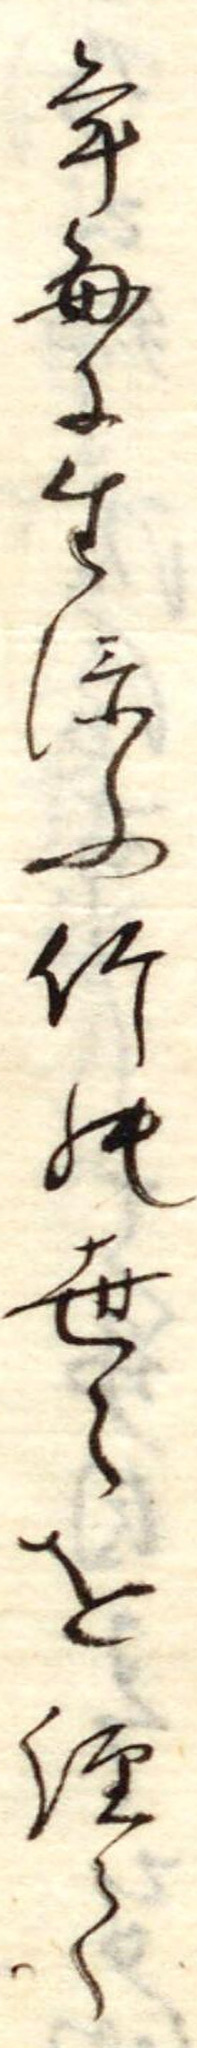年毎に生添ふ竹の世々を経て
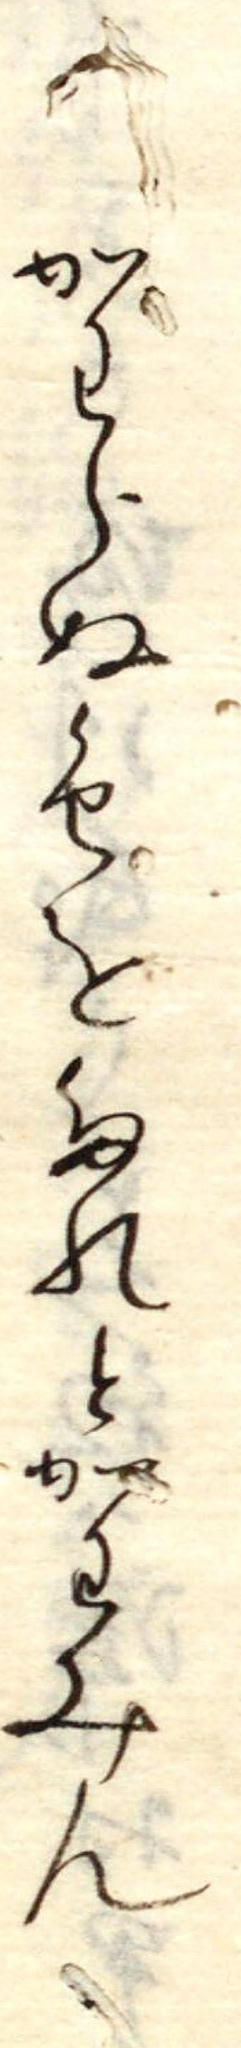かわらぬ色をたれとかわみん
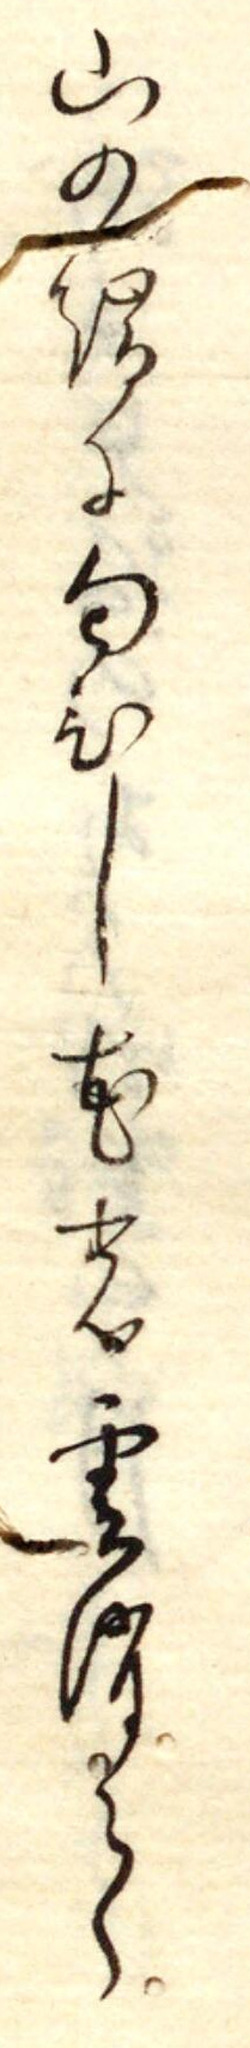山の端に匂ひし花の雲消て

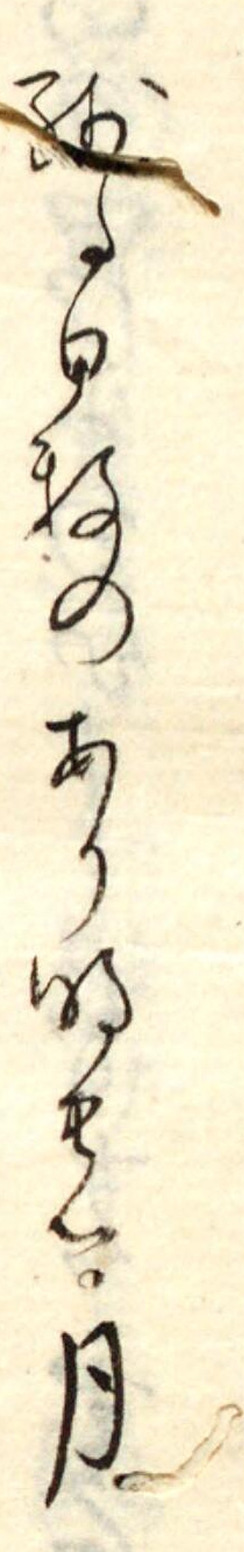残る日数のあり明の月
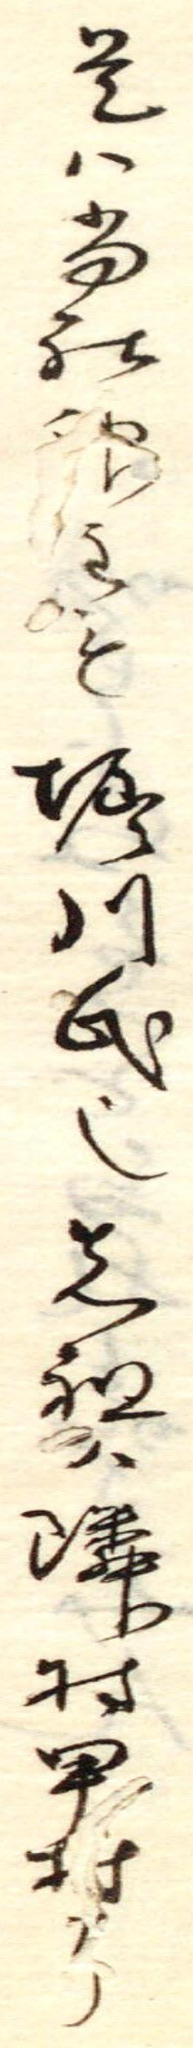是は当社神主も堀川氏也先祖は隣村甲村
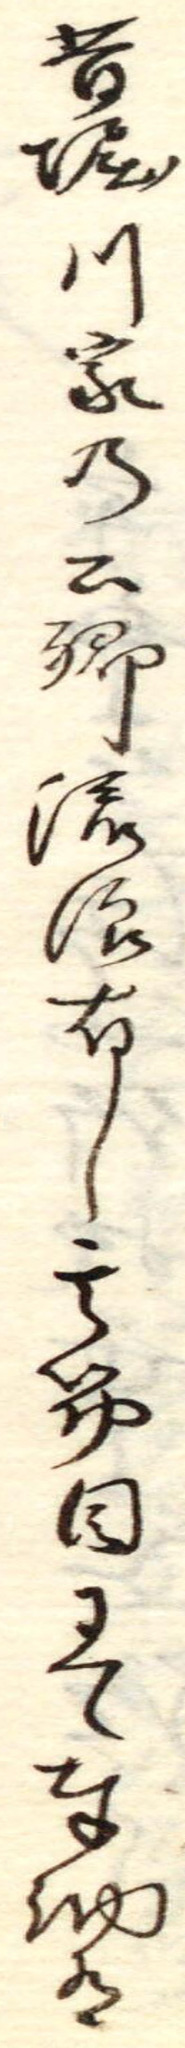昔堀川家の公卿流浪有し其筋目にて奉納有
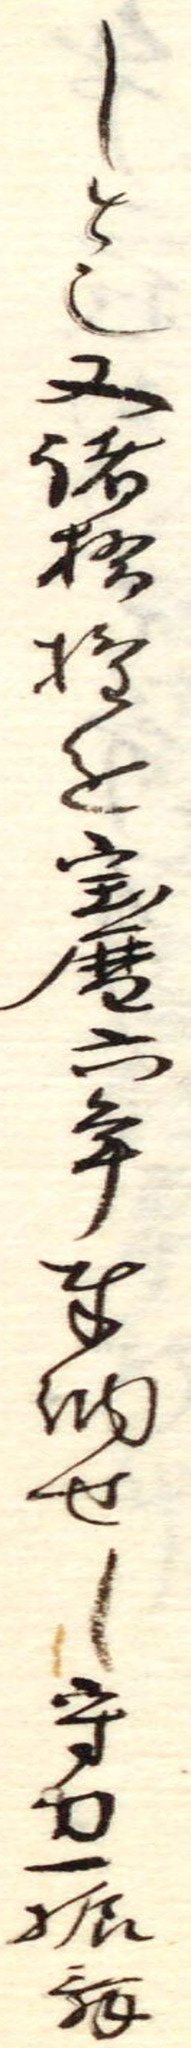しと也又諸橋権進を宝暦六年奉納せし守刀一振り舞
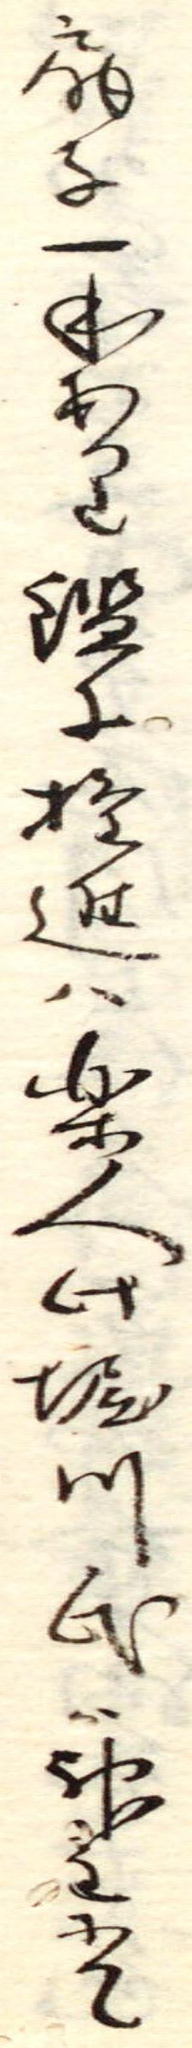扇子一本あり鑑に権進は楽人此堀川氏は神主にて
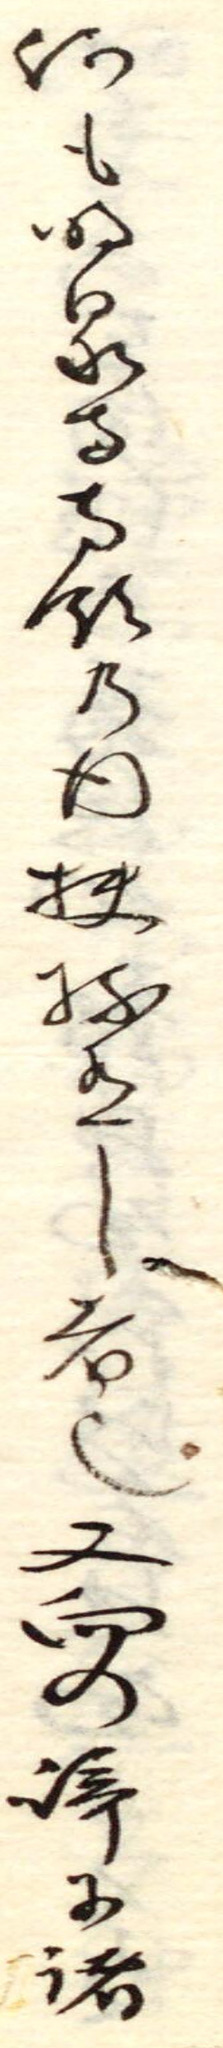何も明泉寺寺領の内扶持有し者也又向の崎に諸
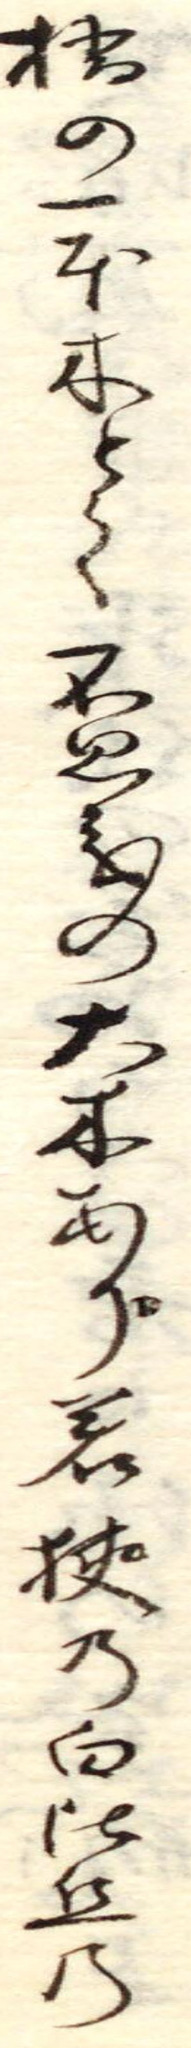橋の一本木とて不思義の大木あり若狭の白比丘の
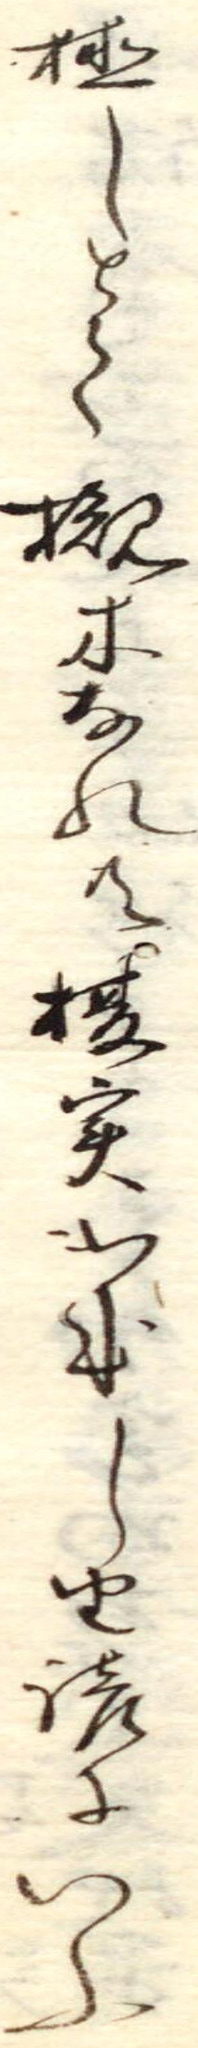植しとて槻木なれ共榎実弐本之由諺にいふ
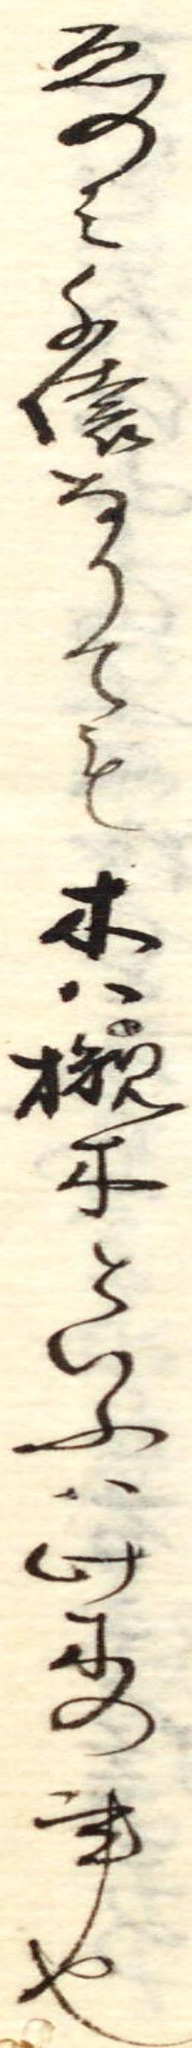ゑのみ千俵なりても木は槻木といふは此木の事也
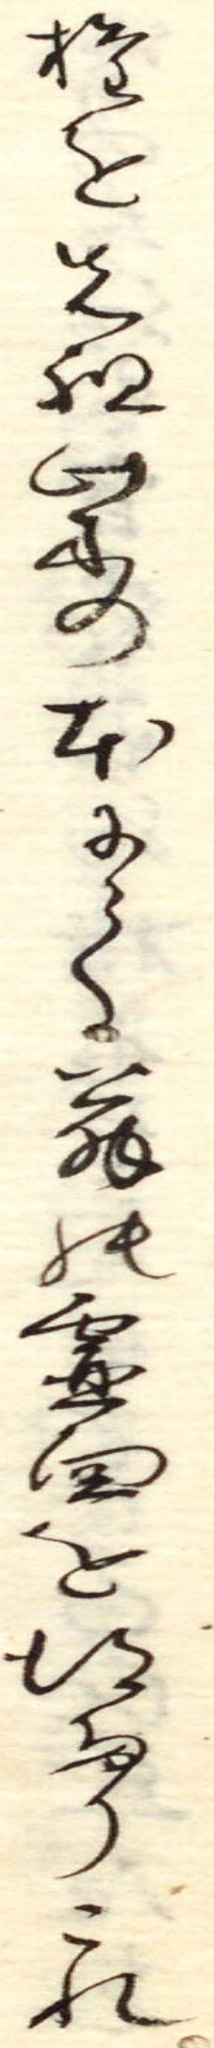権進先祖此木の本にて翁の霊向を得たりこれ
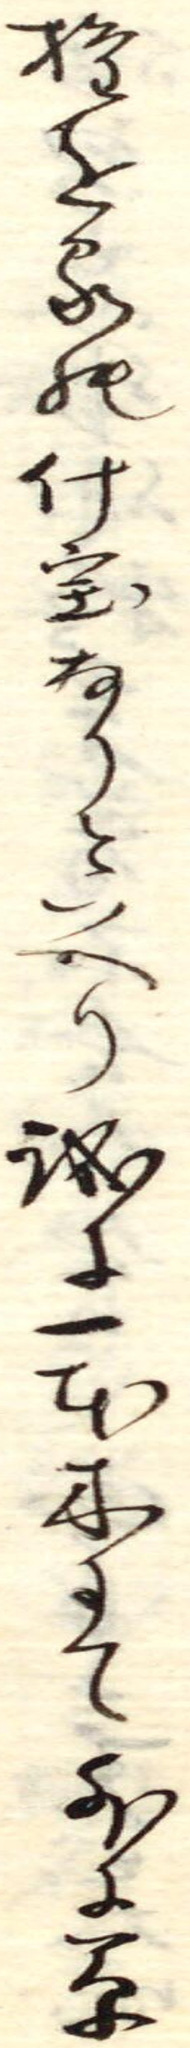権進家の什宝なりといへり誠に一本木にて外に草
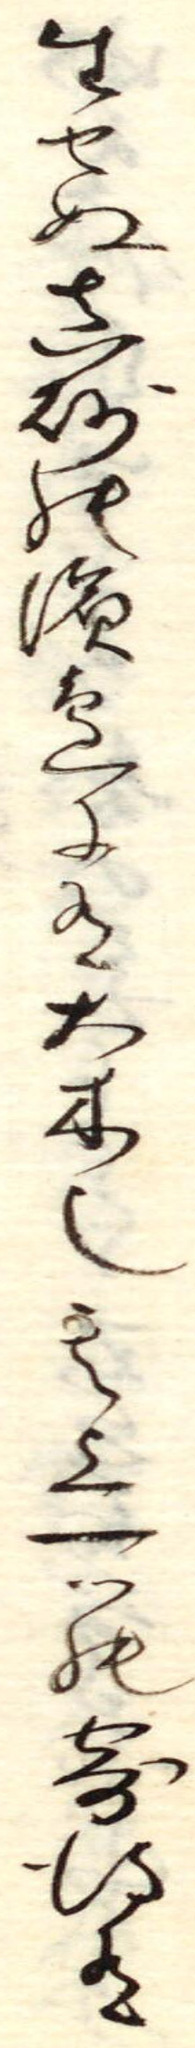生せぬ真砂の浜辺に有大木也其上一ッの寄得有
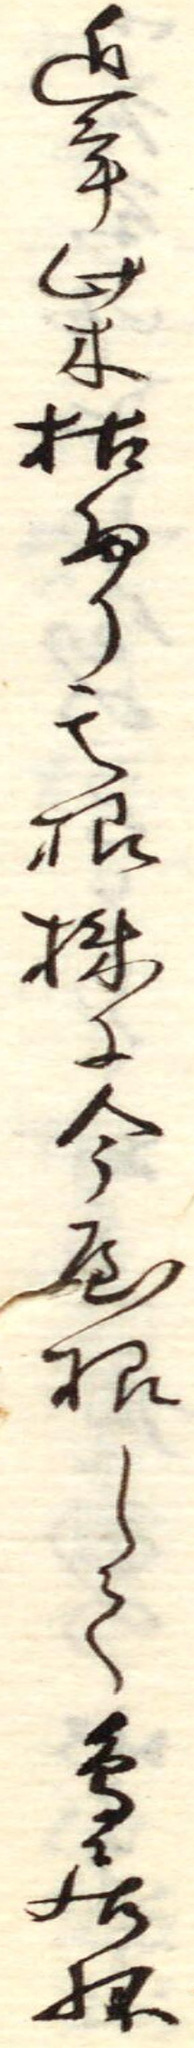近年此木枯たり其根株に今屋根して鳥居抔
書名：能登名跡誌
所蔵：Ishikawa Prefectural Library
